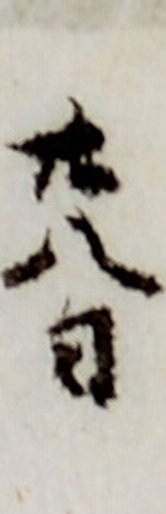廿八日
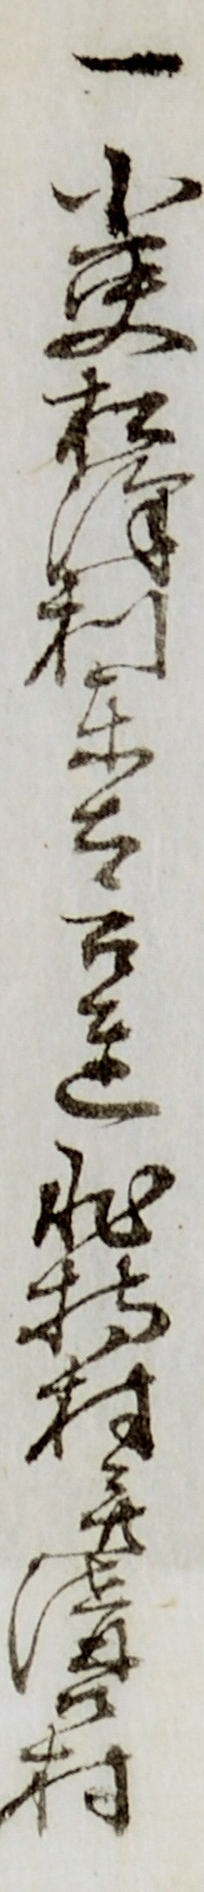一小吏松沢利東太召連非持村幷溝口村
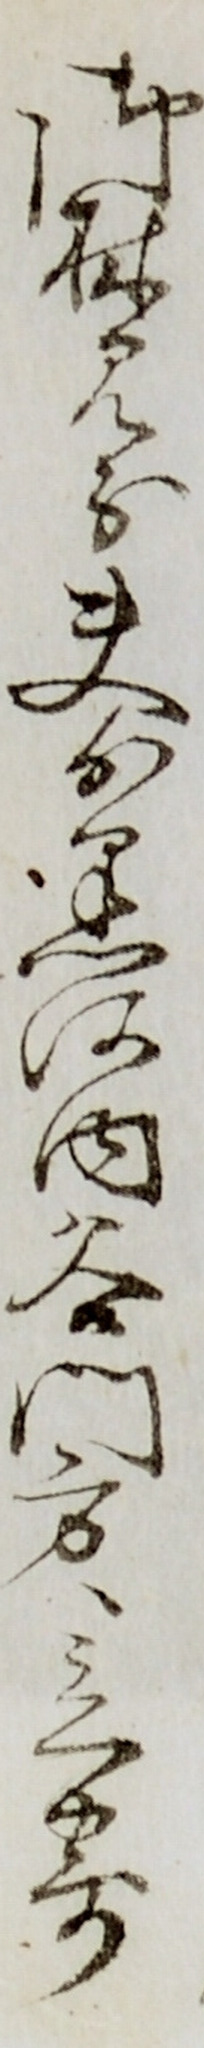御林見分夫ゟ黒河内谷門方へ立寄
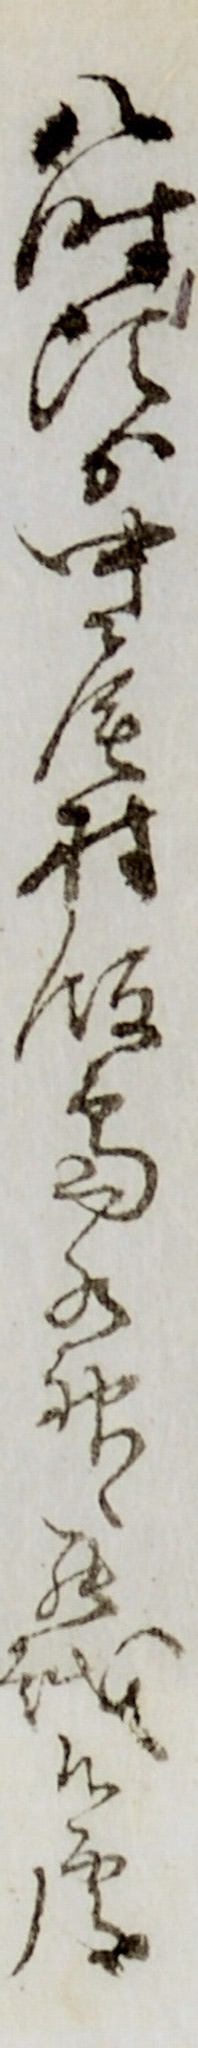八時頃ゟ中尾村飯島水神へ罷越候処
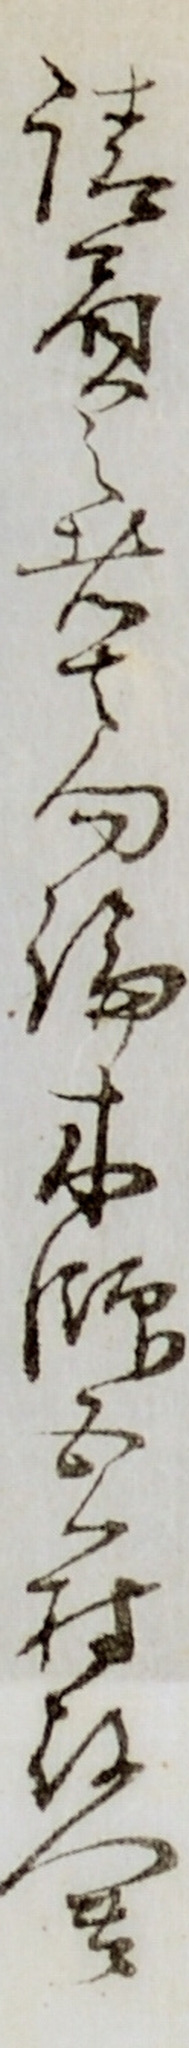請負之者は勿論木師五ヶ村役人共
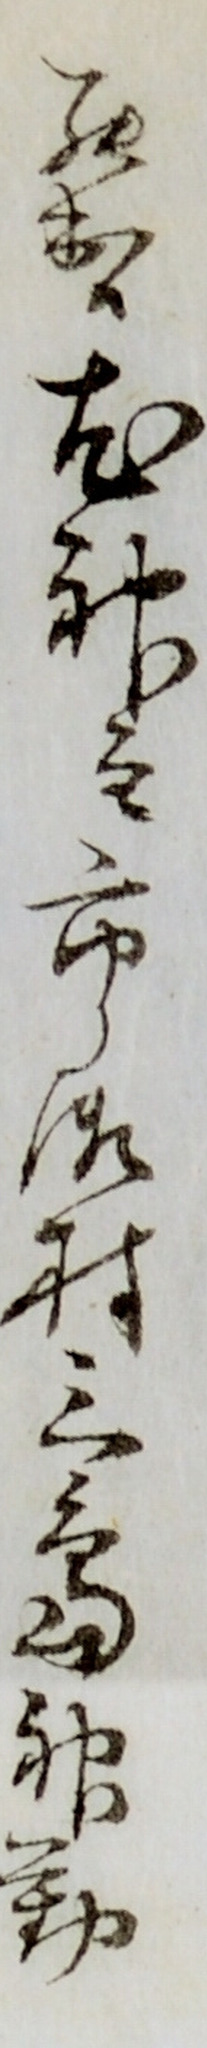罷出候尤神主市瀬村三島神勤
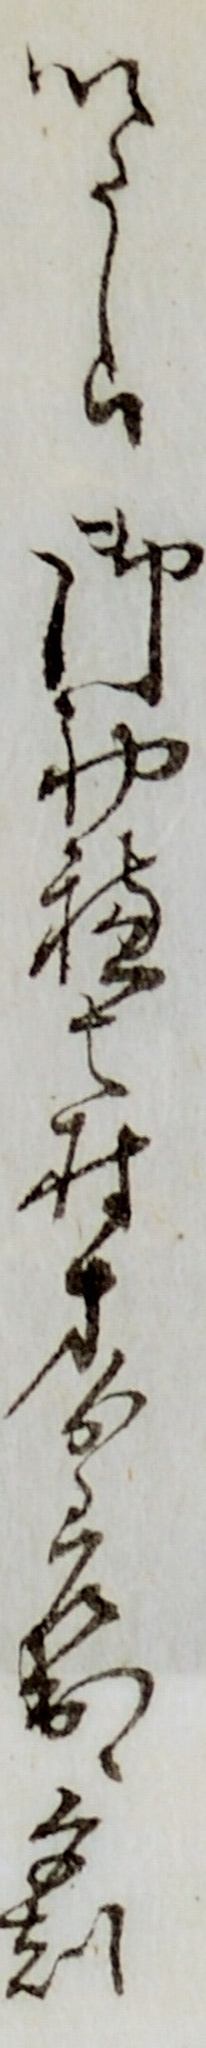いたし候御初穂は村方ゟ差出候夕刻
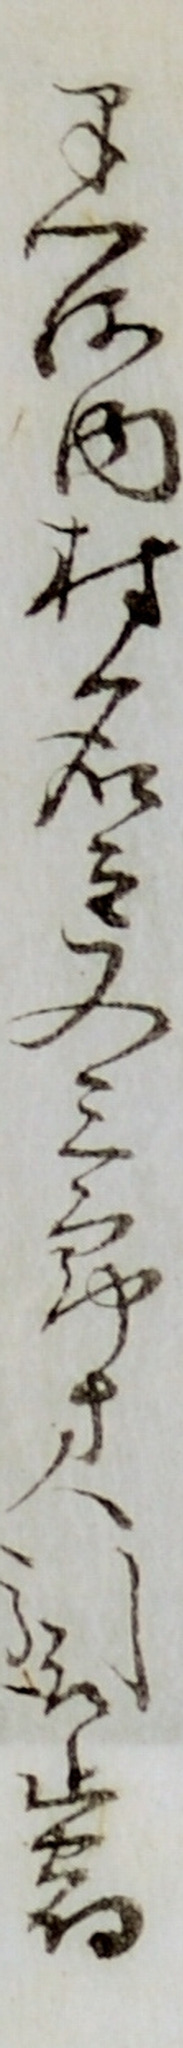黒河内村名主又三郎方へ引取止宿

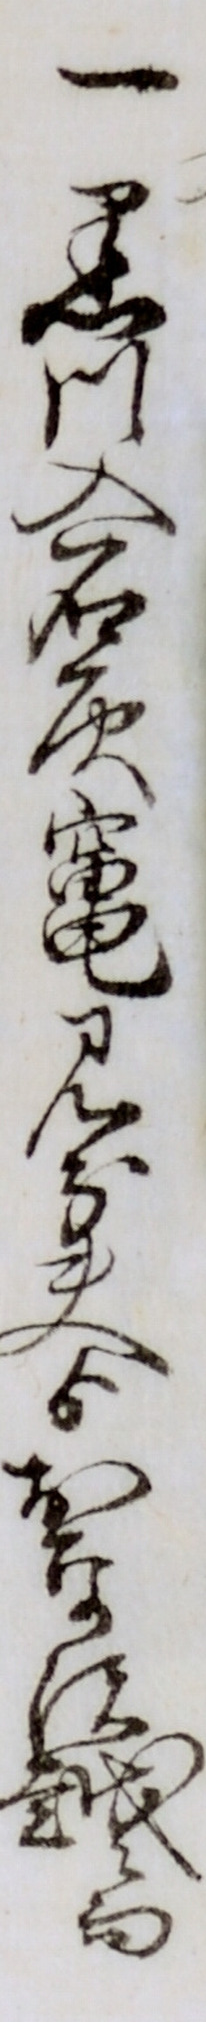一黒川入石灰竃見分夫ゟおな沢越にて
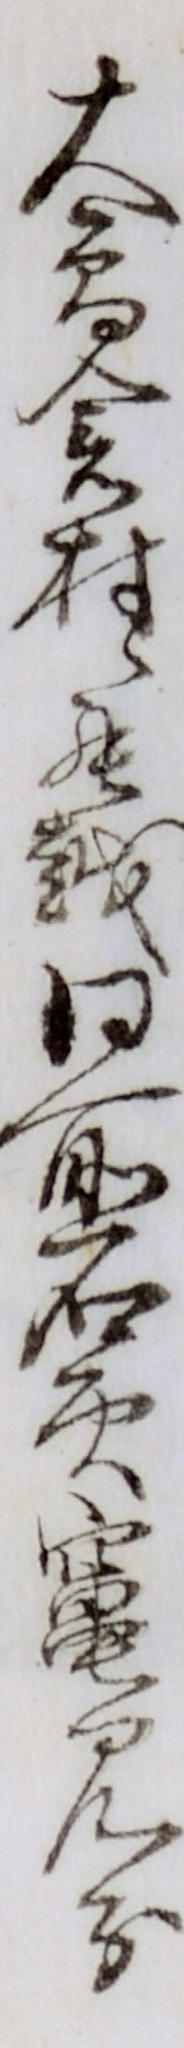大曽倉村へ罷越同所石灰竃見分
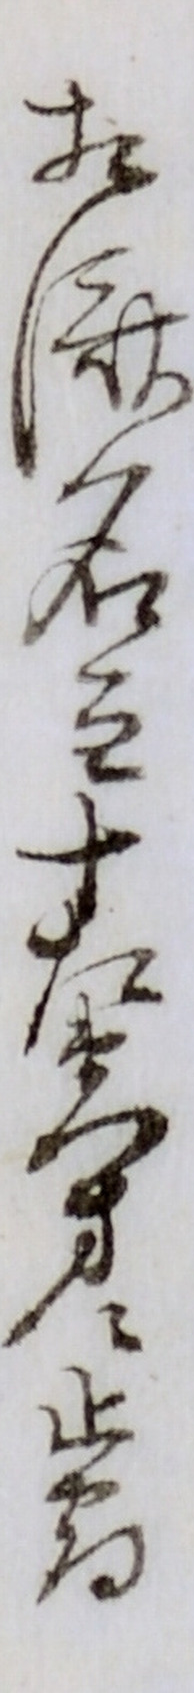相済名主十左衛門方に止宿

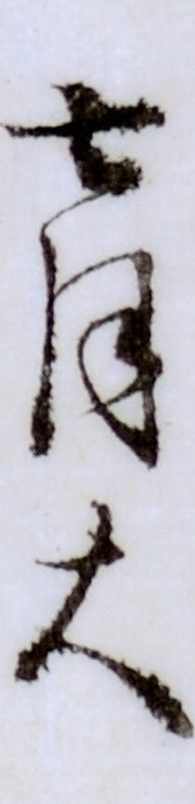七月大
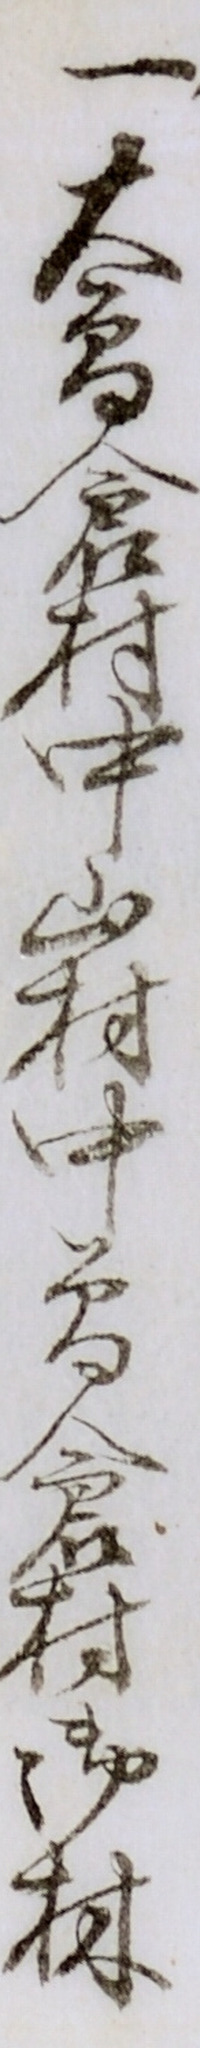一大曽倉村中山村中曽倉村御林
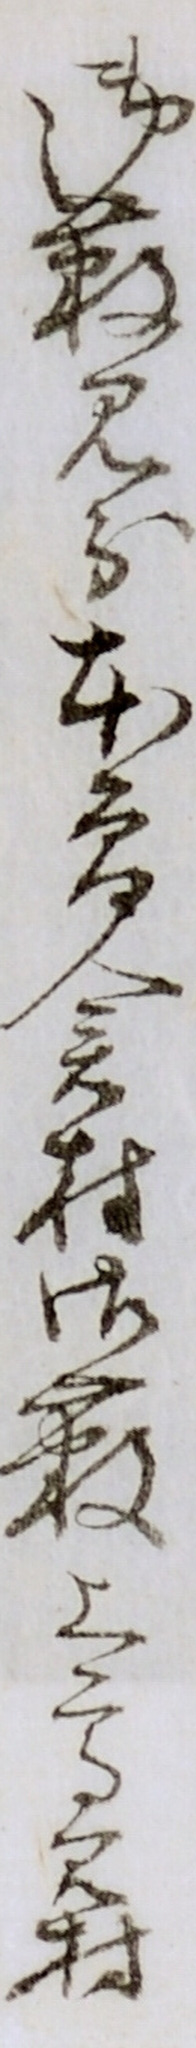御薮見分本曽倉村御薮上高見村
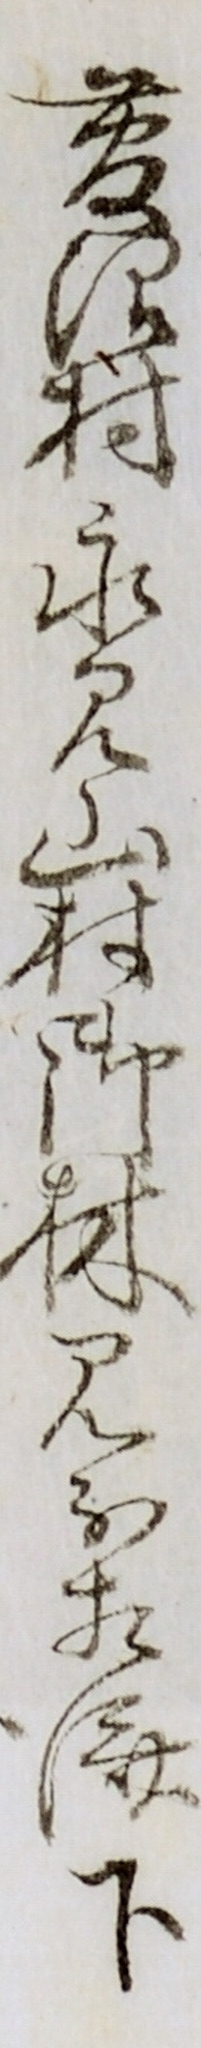菅沼村永見山村御林見分相済下
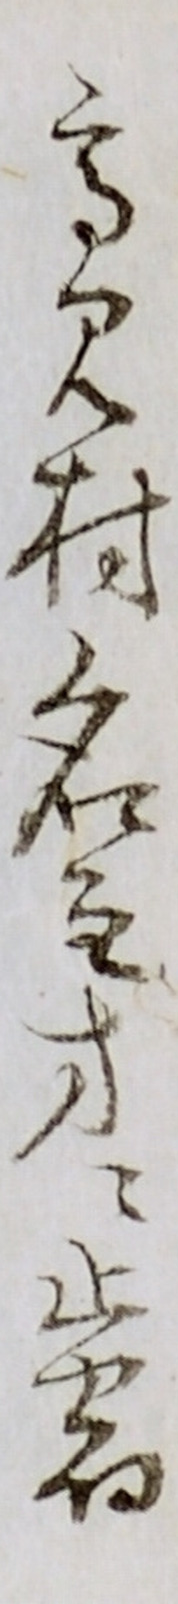高見村名主方に止宿
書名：山林方諸事御用留
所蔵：伊那市立高遠町図書館・合同会社AMANE
